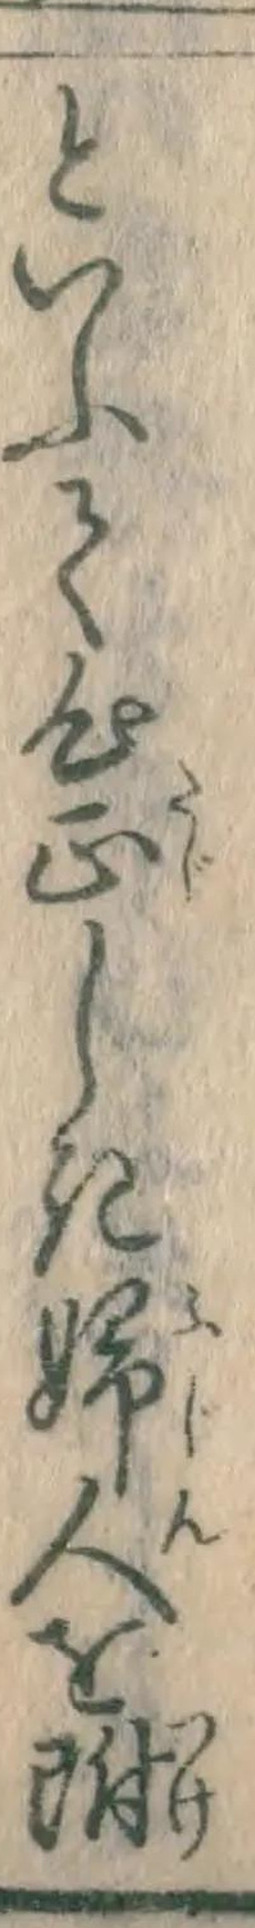といふて心正しき婦人を附
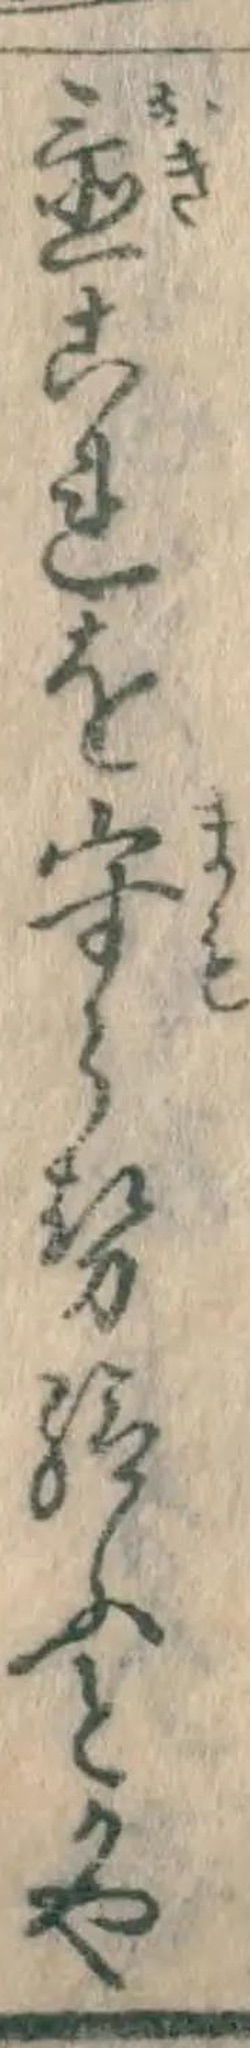置これを守らせ給ふとかや
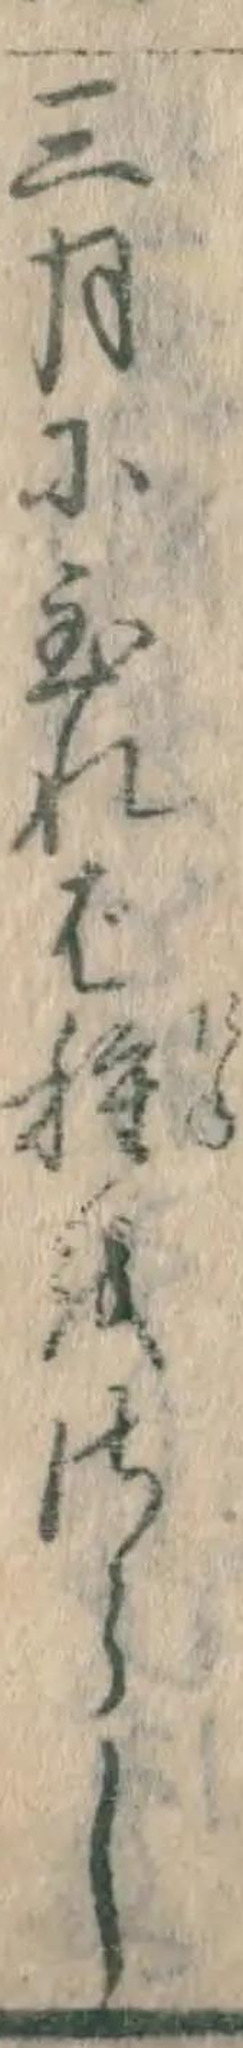三月に至れば種をさらし
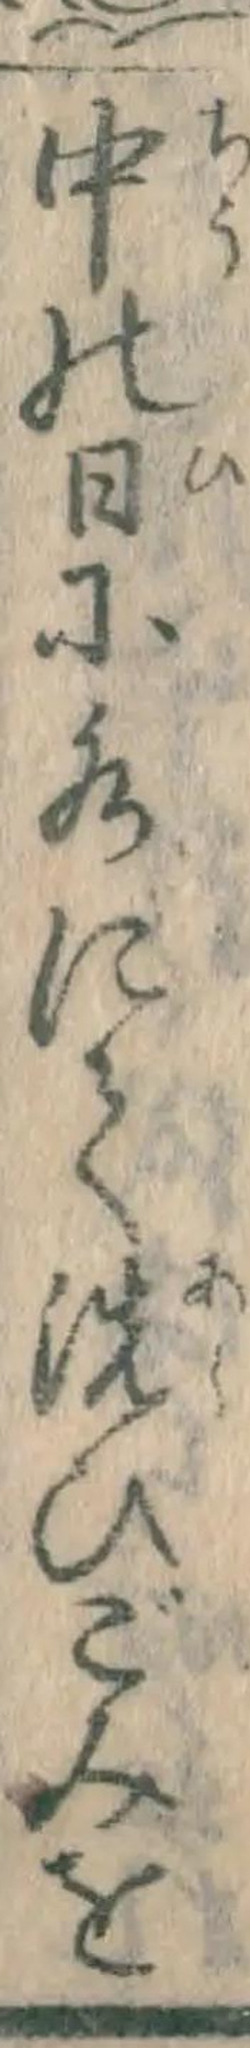中の日に水にて洗ひごみを

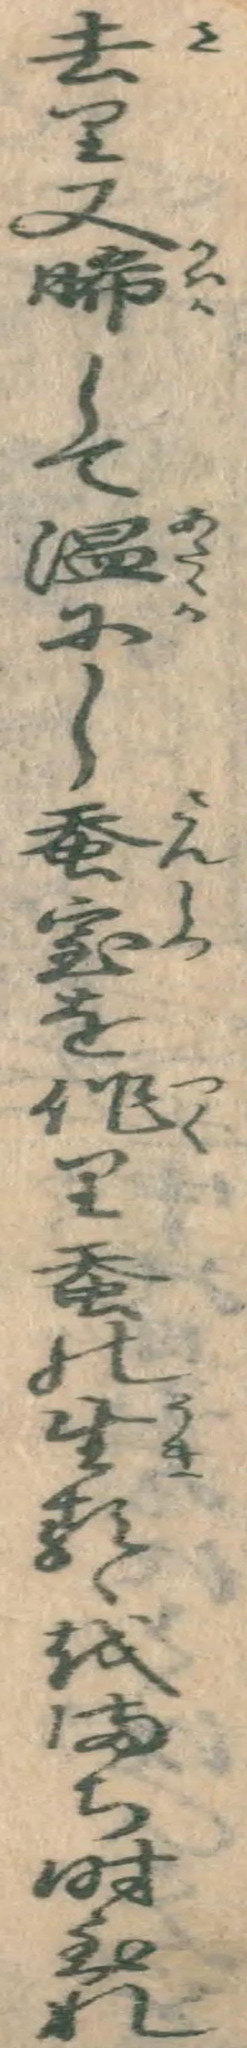去り又晞して温にし蚕室を作り蚕の生るゝをまち時至れ
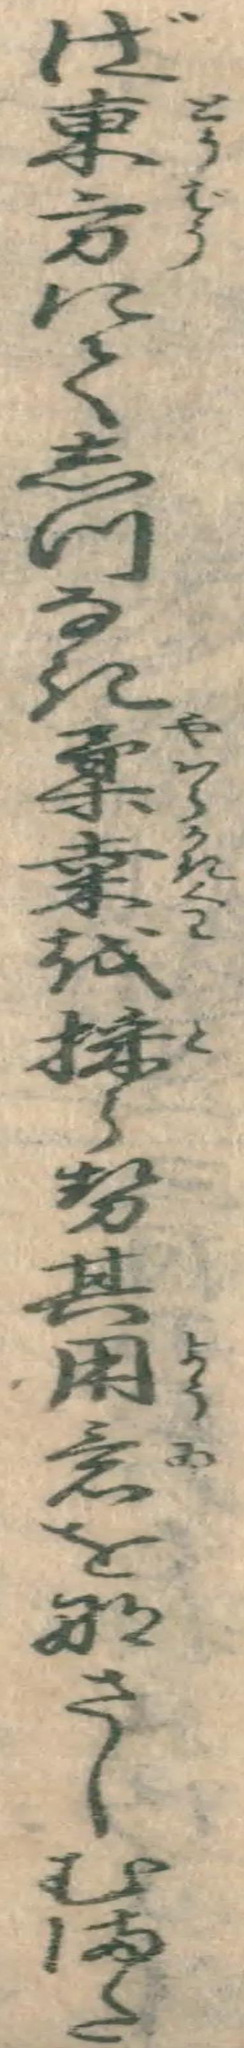ば東方にてしつなき柔桑を採らせ其用意をなさしむまた
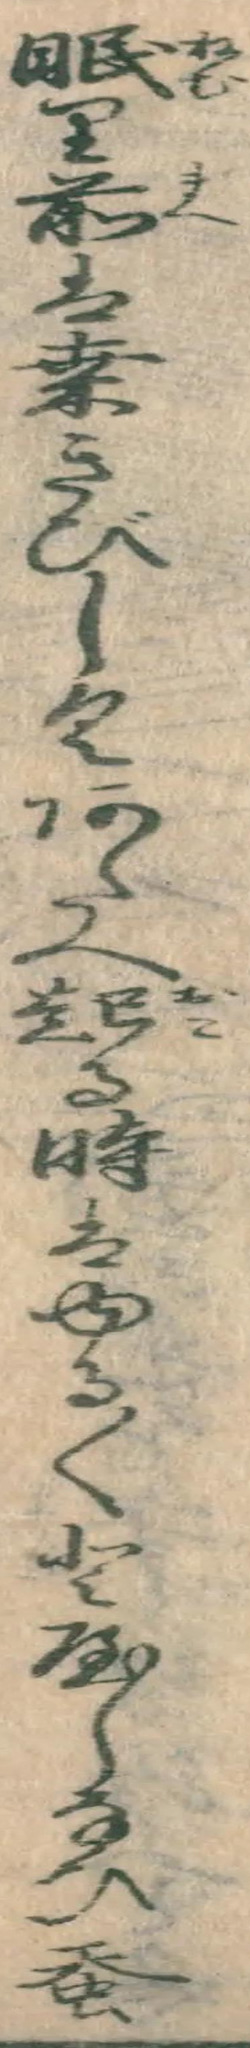眠り前は桑きびしくあたへ起る時はゆる〳〵とやしなひ蚕
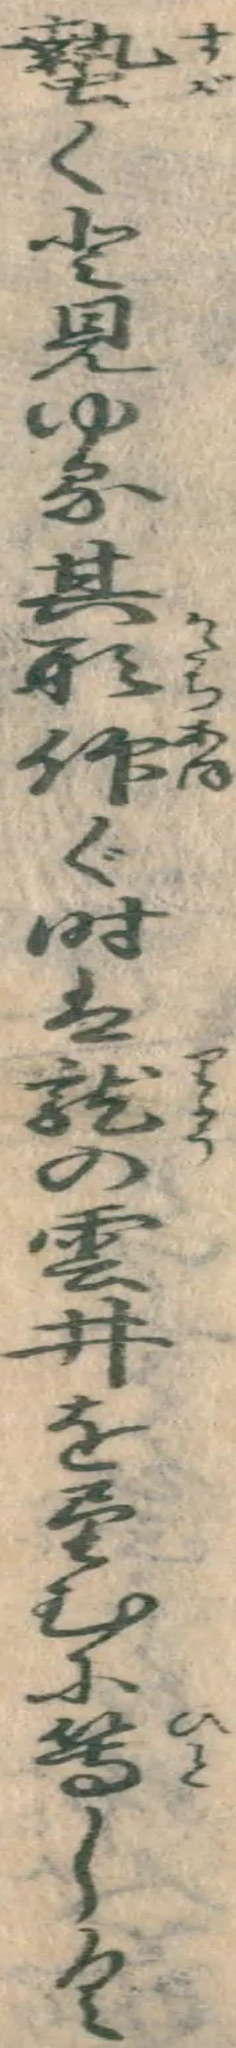蟄くと見ゆる其形仰ぐ時は龍の雲井を望むに等しく
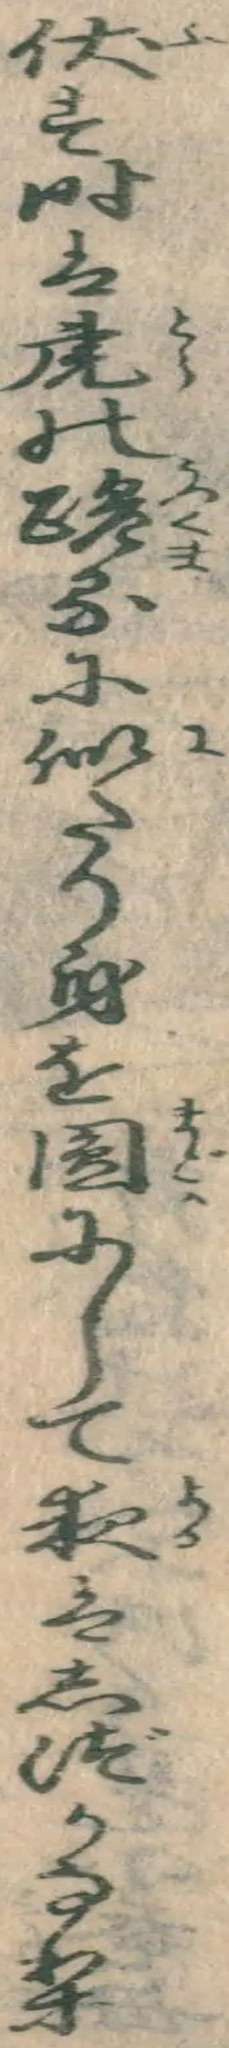伏す時は虎の跪るに似たり身を円にして夜はしづかなり
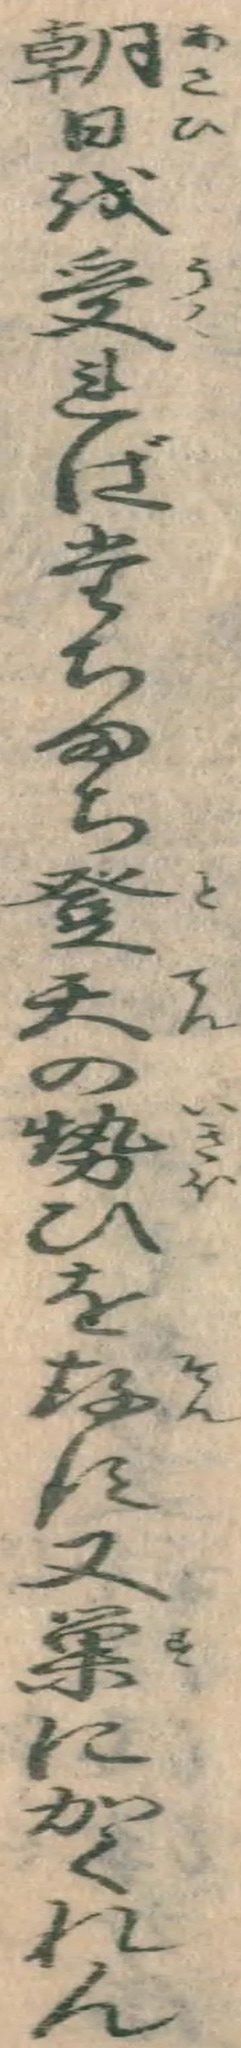朝日を受ればたちまち登天の勢ひを存す又巣にかくれん
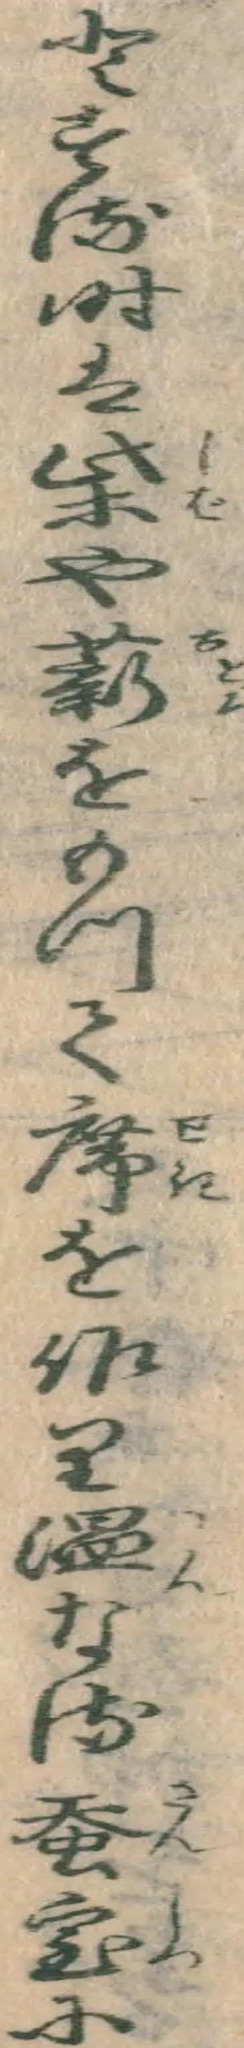とする時は柴や薪をもつて席を作り温なる蚕室に
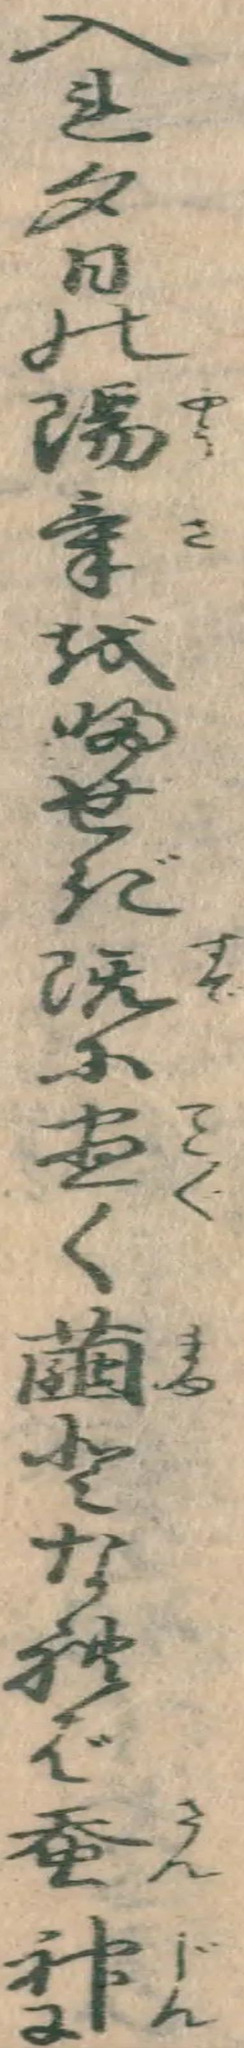入れ夕日の陽気をふせぎ既に尽く繭となれば蚕神に
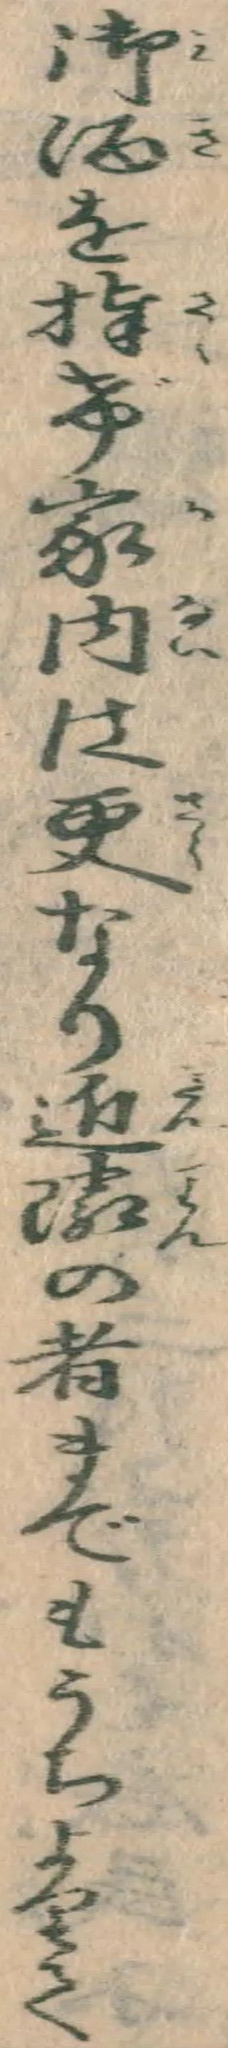御酒を捧げ家内は更なり近隣の者までもうちよりて
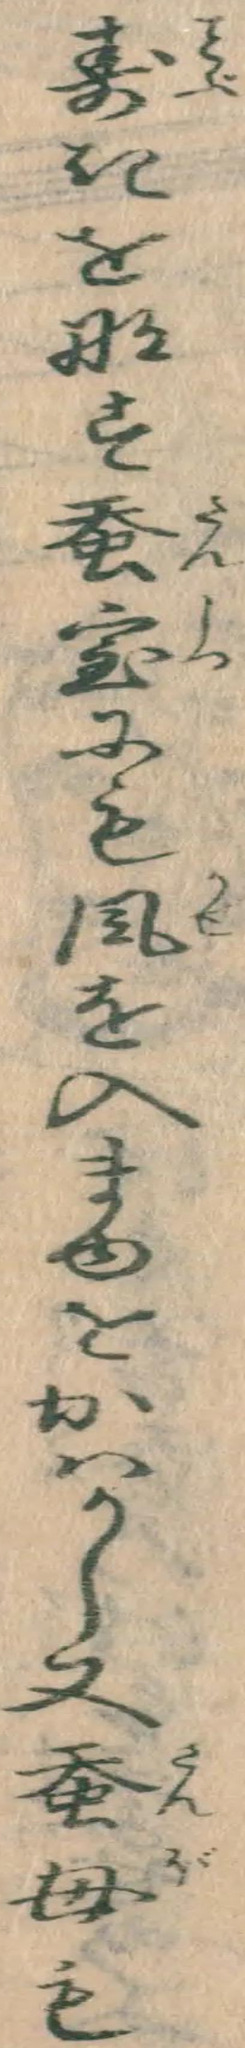寿きをなす蚕室にも風を入まゆをかはかし又蚕母も
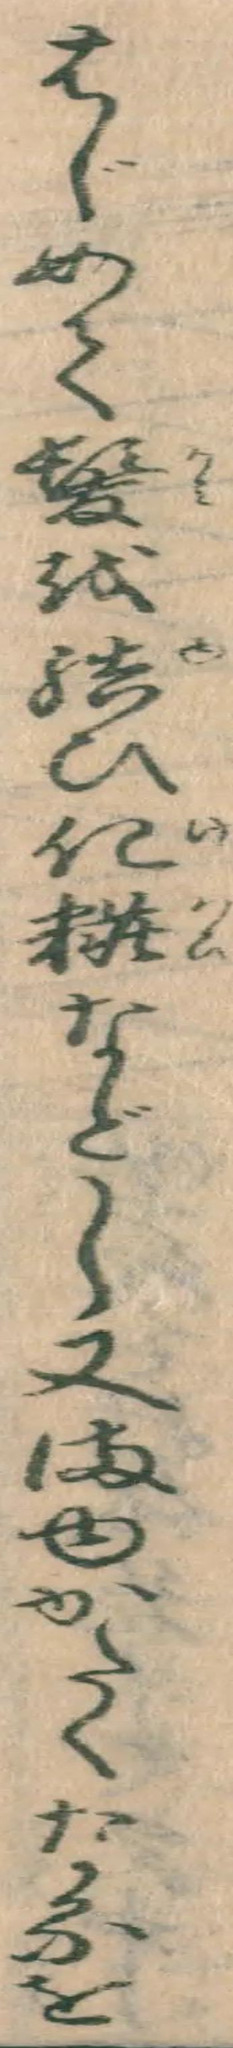はじめて髪を結ひ化粧などし又まゆかたくなるを
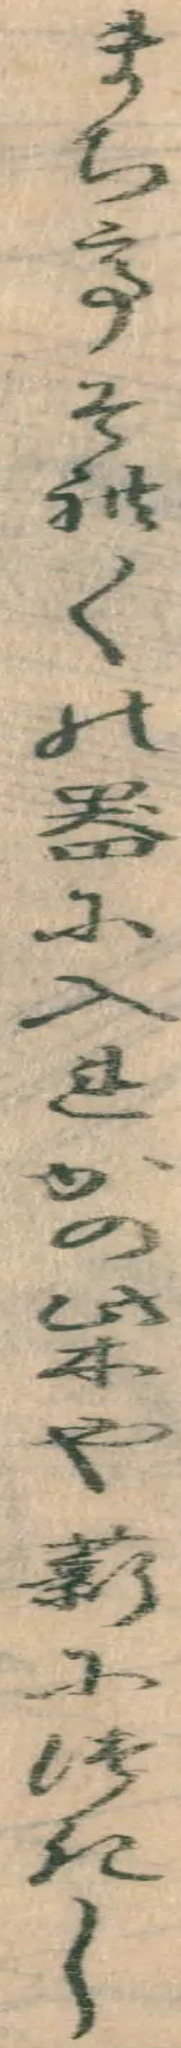まちてそれ〳〵の器に入れかの柴や薪につきし
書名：養蚕秘録 3巻. [1]
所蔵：国立国会図書館 National Diet Library, JAPAN
